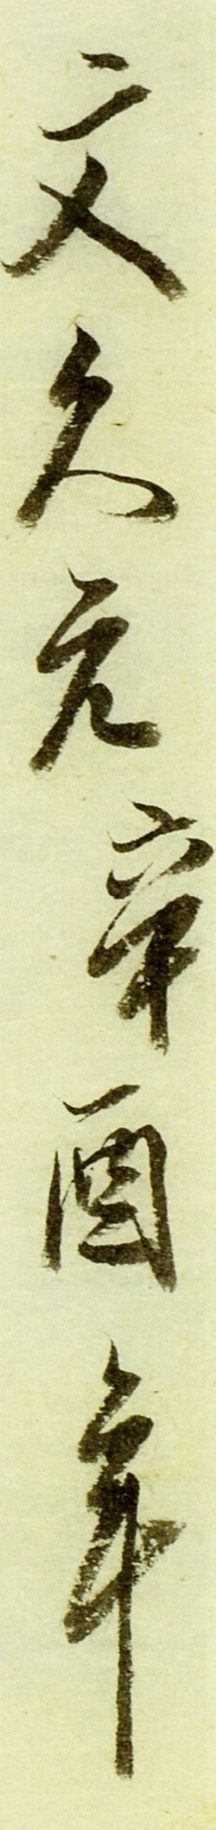文久元辛酉年
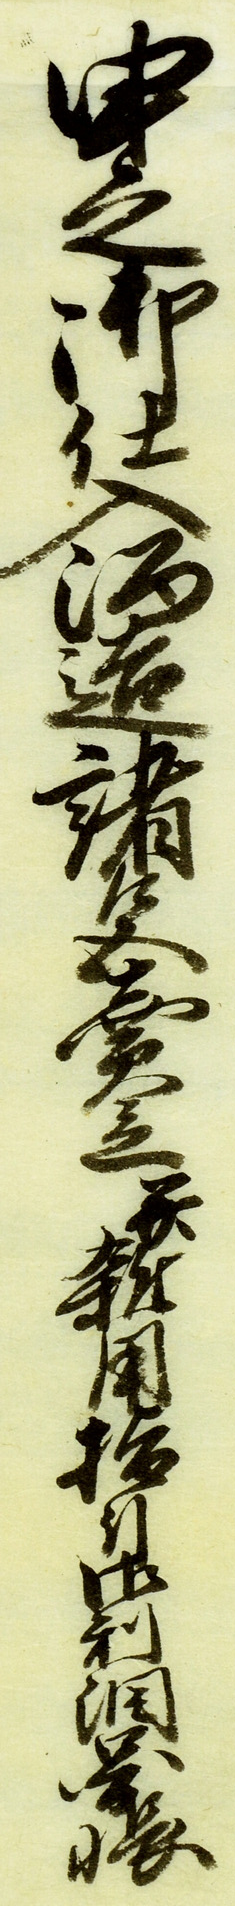申之御仕入酒造諸色売立并雑用指引御利潤図帳
